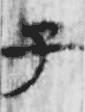子
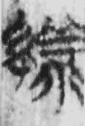佩
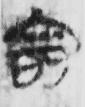命
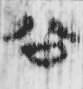公
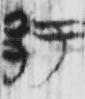邘
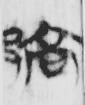鄗
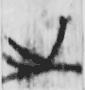之
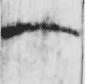一
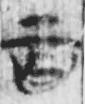百
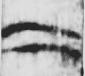二
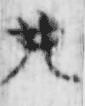四
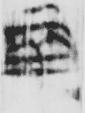兩
